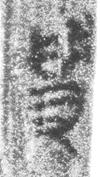○（葬）
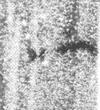一
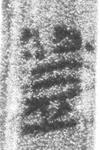良
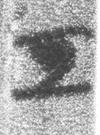○（圓）
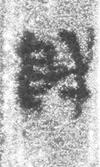軒
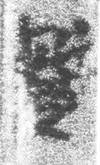載
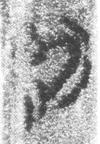紡
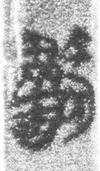○（蓋）
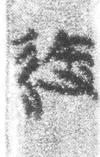{糸午又}
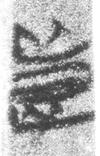良
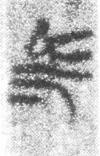馬
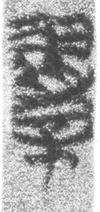○（翠）
